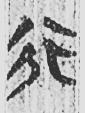行
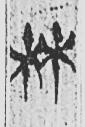林
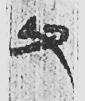父
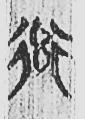率
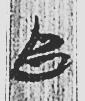𠂤
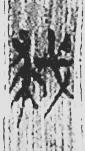{求戈}
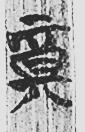奠
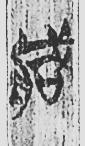戕（莊）
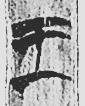王
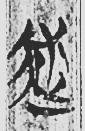述
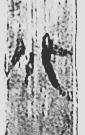北
